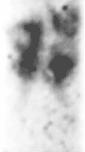無
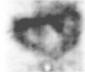四
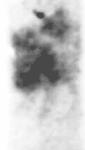鞁
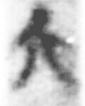六
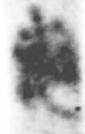○（轡）
